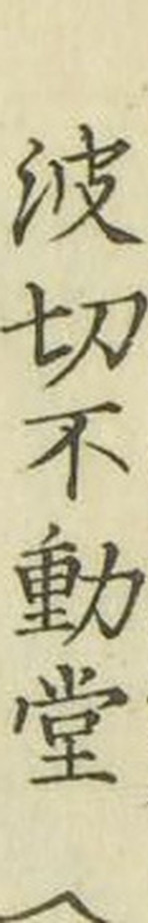波切不動堂

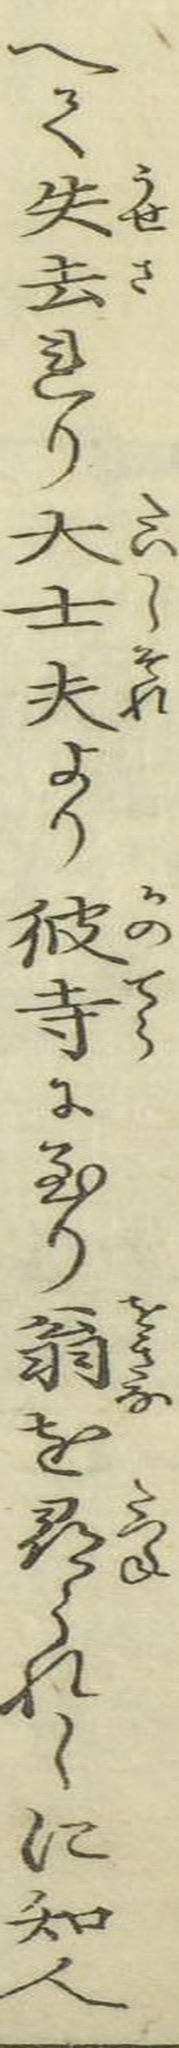へて失去れり大士夫より彼寺に至り翁を尋られしに知人
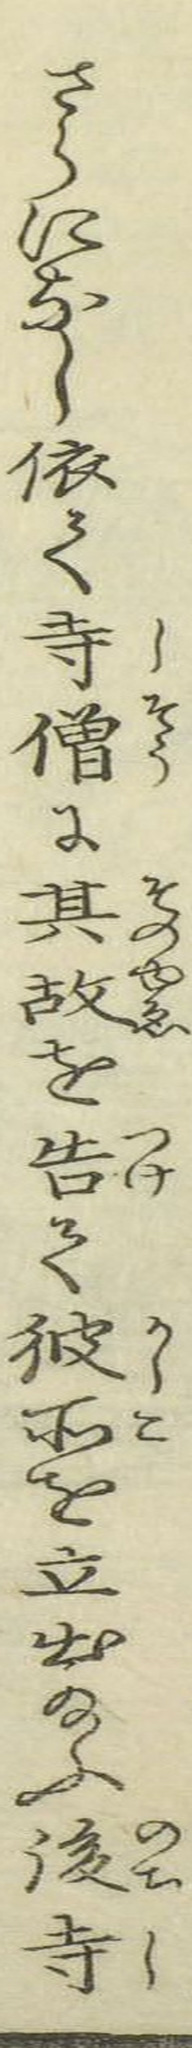さらになし依て寺僧に其故を告て彼所を立出給ふ後寺
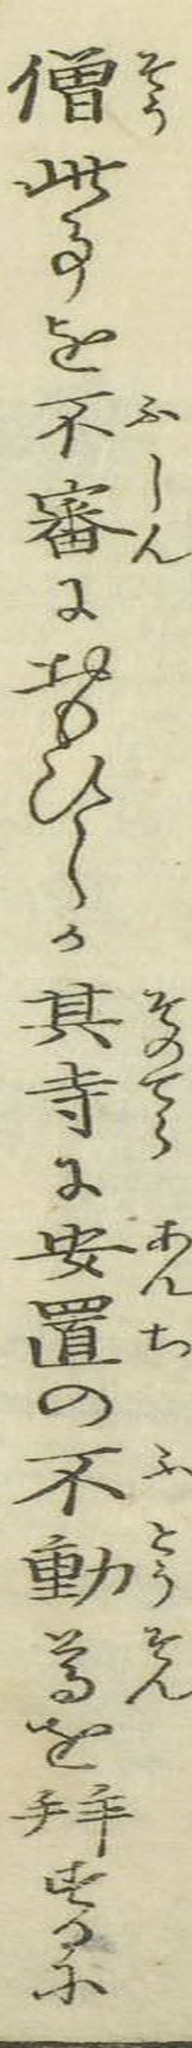僧此事を不審におもひしか其寺に安置の不動尊を拜するに
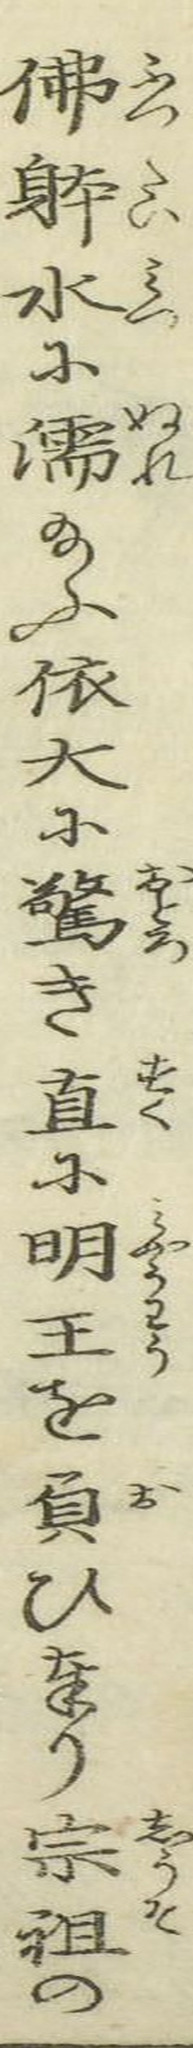佛躰水に濡給ふ依大に驚き直に明王を負ひ奉り宗祖の
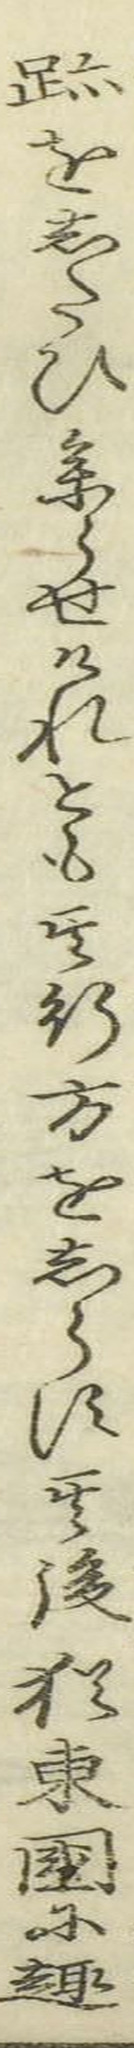跡をしたひ参らせけれとも其行方をしらす其後猶東國に趣
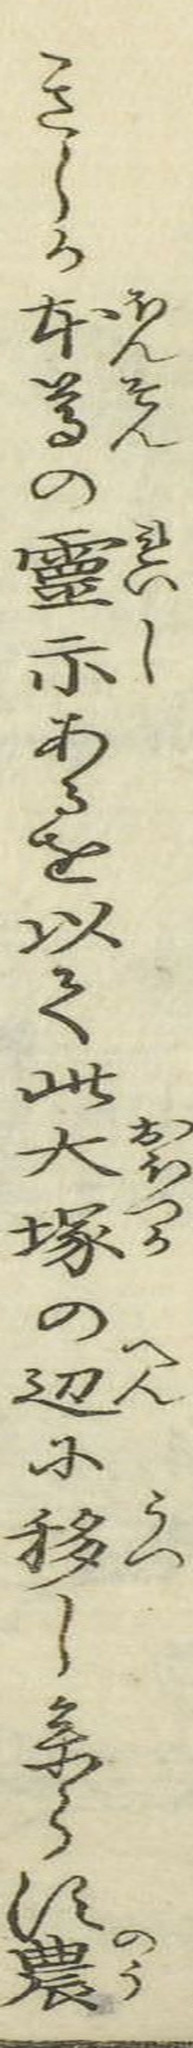きしか本尊の霊示あるを以て此大塚の辺に移し参らす農
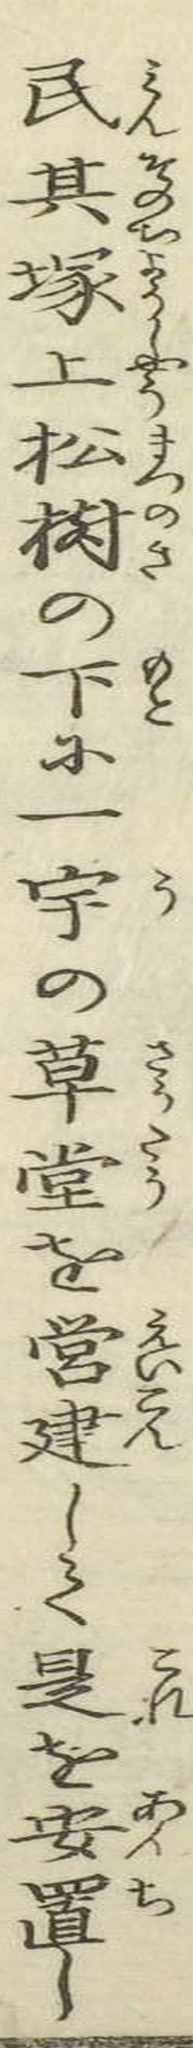民其塚上松樹の下に一宇の草堂を営建して是を安置し
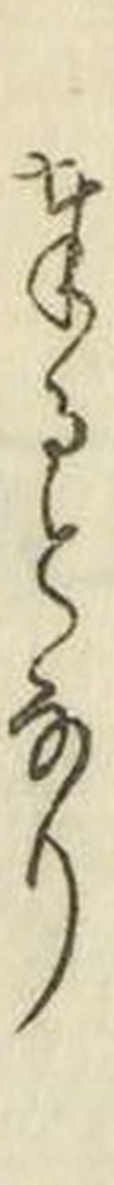奉るとなり
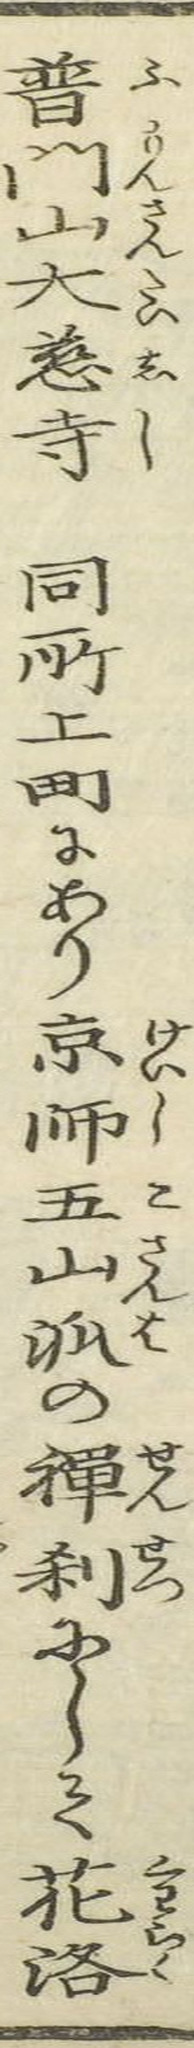普門山大慈寺同所上町にあり京師五山派の禪刹にして花洛
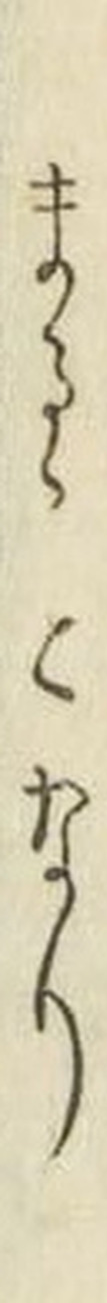奉るとなり
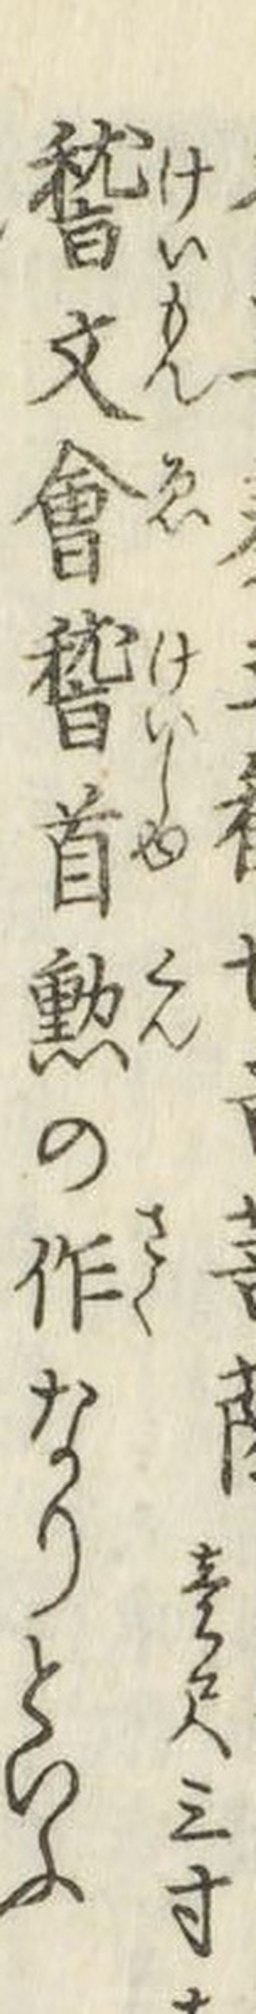稽文會稽首勲の作の作なりといふ
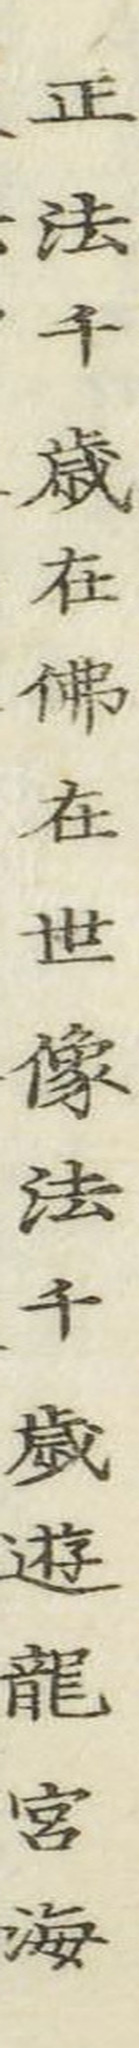正法千歳在佛在世像法千歳遊龍宮海
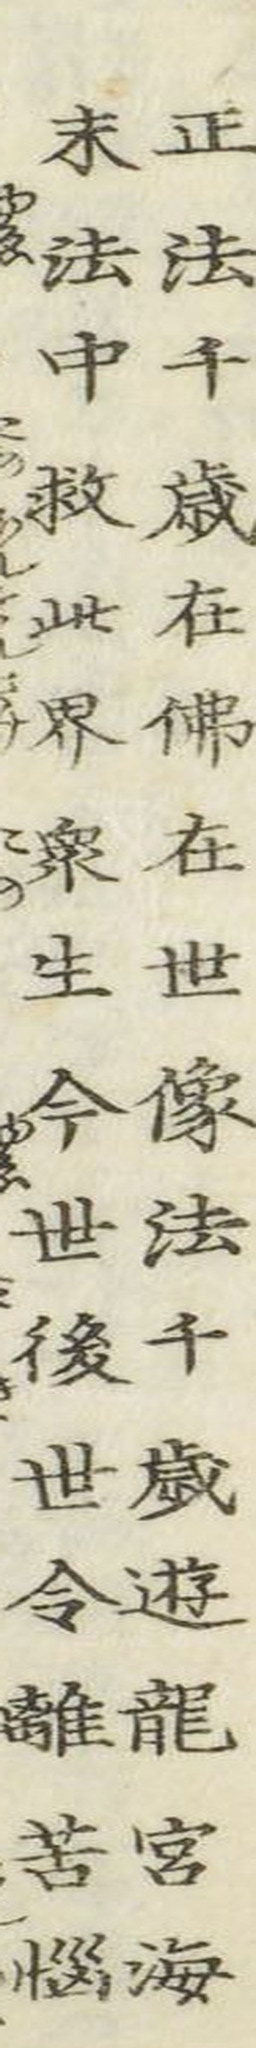末法中救此界衆生今世後世令離苦惱
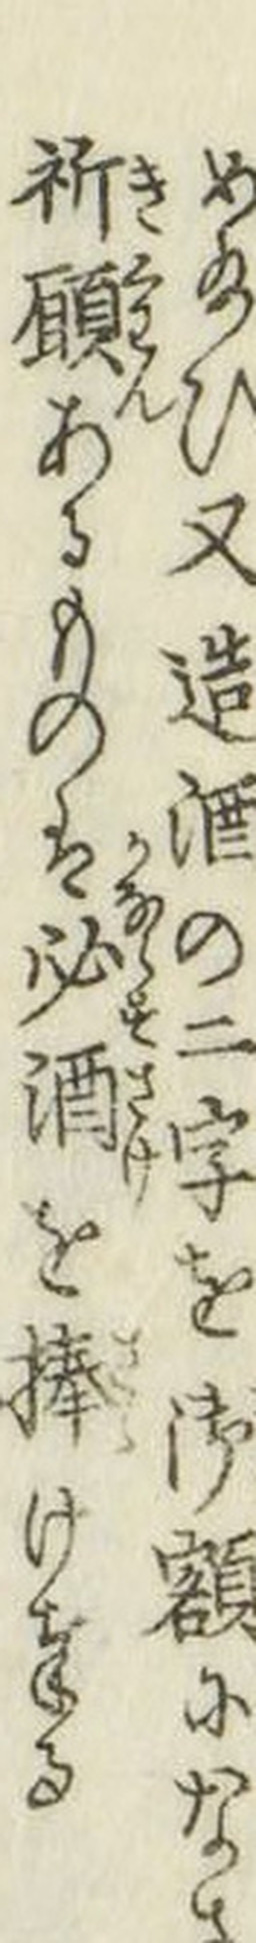祈願あるものは必酒を捧け奉る
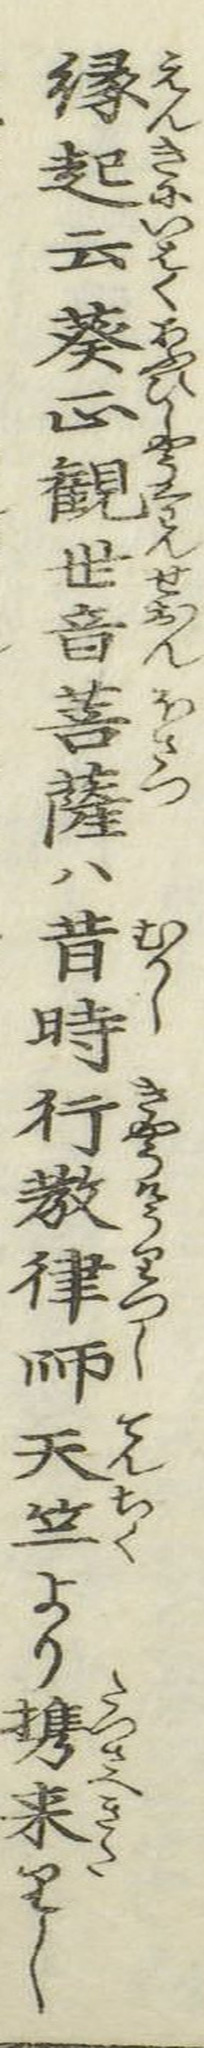縁起云葵正観世音菩薩は昔時行教律師天竺より携来りし
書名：江戸名所図会 20巻 巻之12
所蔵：東京学芸大学教育コンテンツアーカイブ
